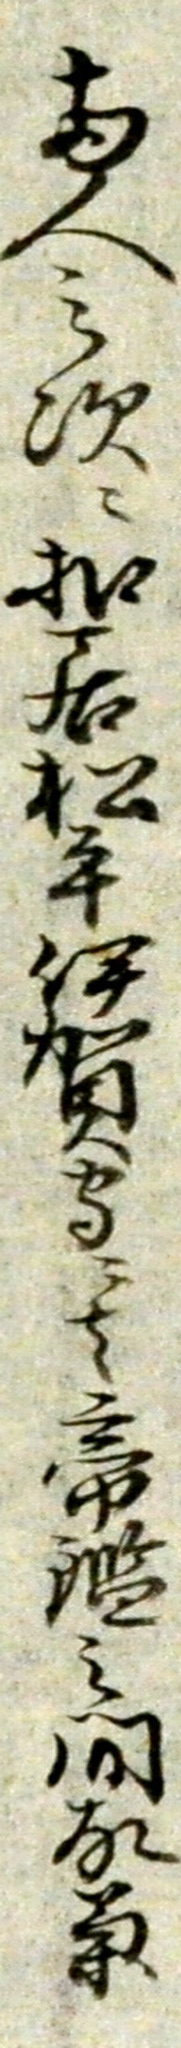両人之次ニ扣居松平伊賀守ニ者帝鑑之間故菊
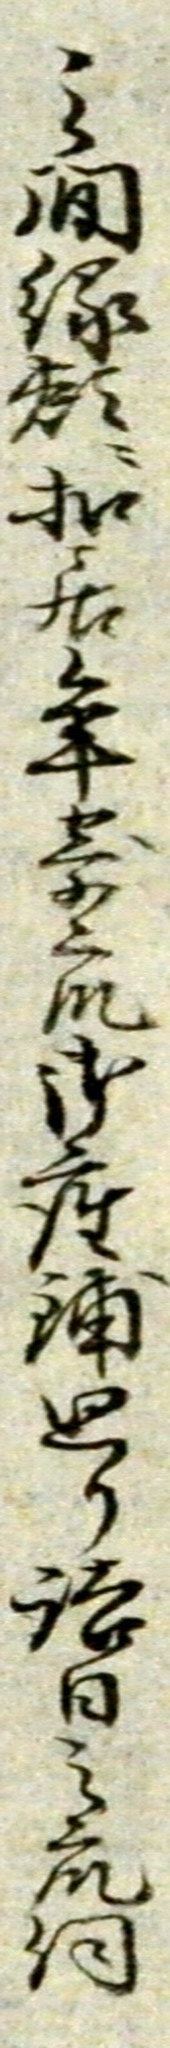之間縁頬ニ扣居年寄衆御座鋪廻り詰日之衆伺
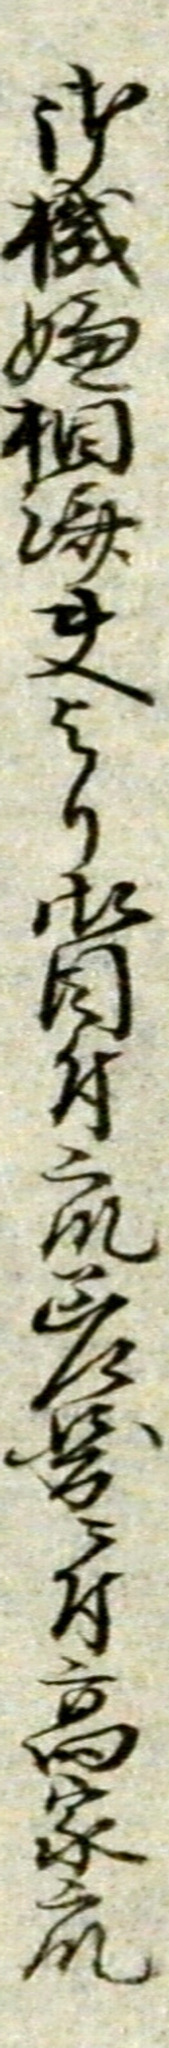御機嫌相済夫より御目付衆差図ニ付高家衆
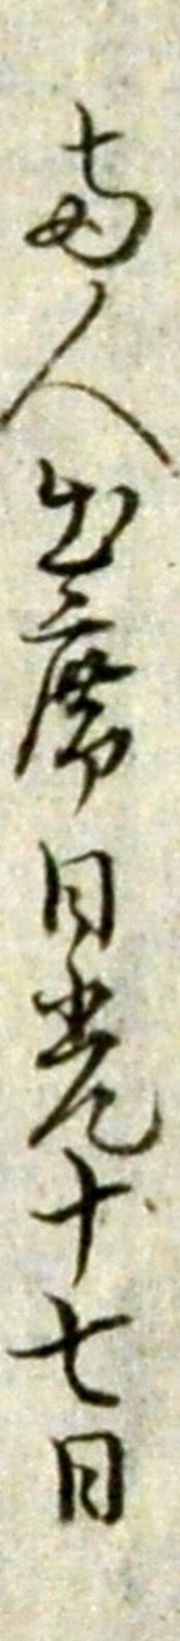両人出席日光十七日
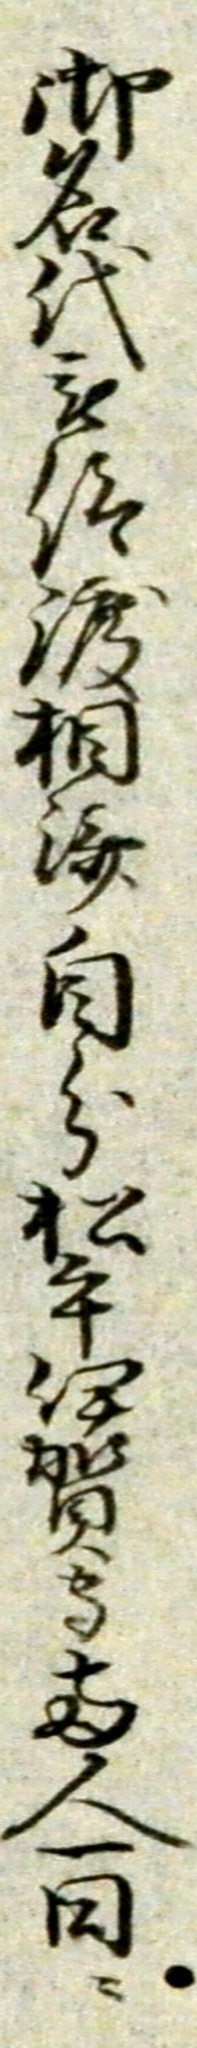御名代被仰渡相済自分松平伊賀守両人一同ニ
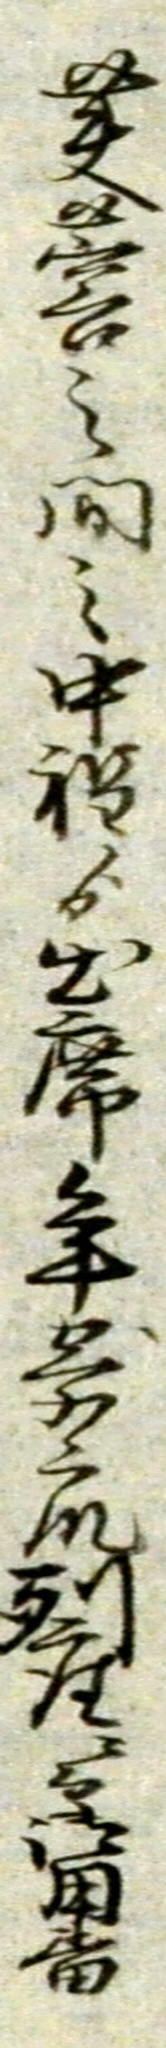芙蓉之間之中程ゟ出席年寄衆列座ニ而御用番
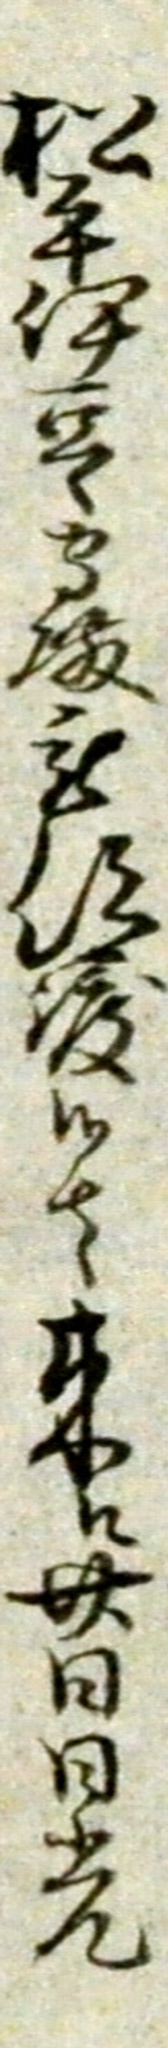松平伊豆守殿被仰渡候者来ル廿日日光
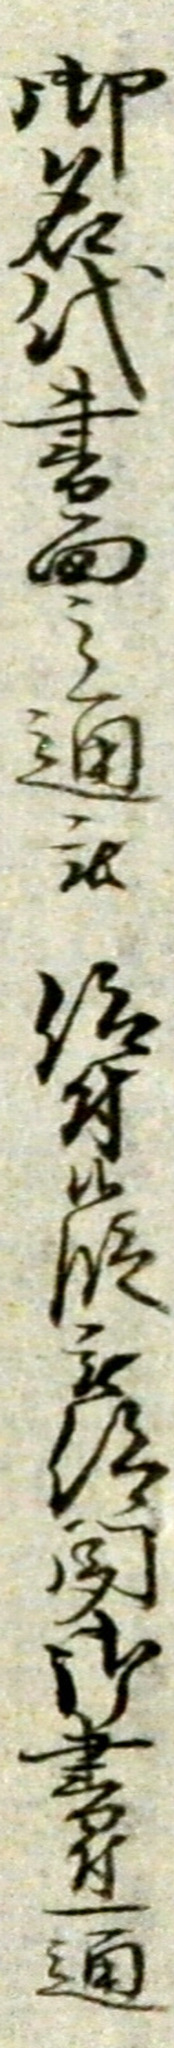御名代書面之通被仰付候段被仰聞御書付一通

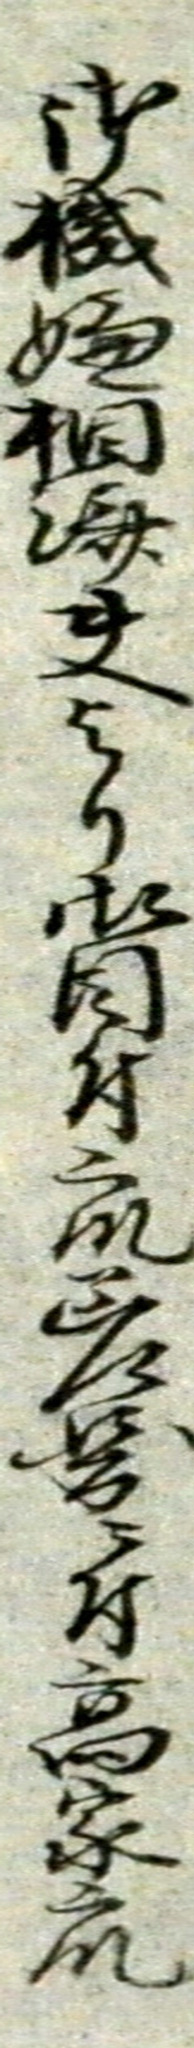御機嫌相済夫より御目付衆差図ニ付高家衆
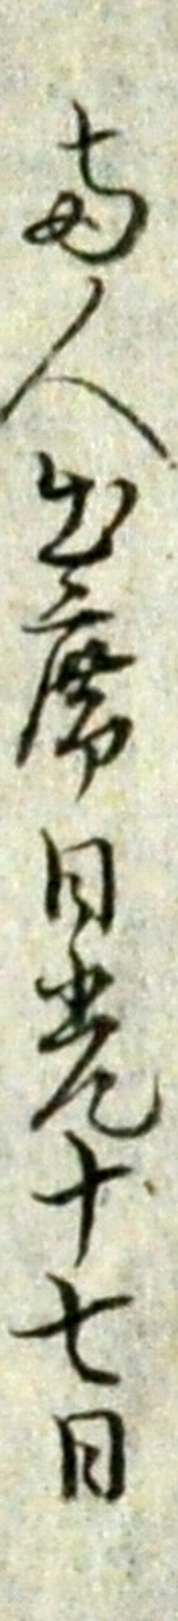両人出席日光十七日
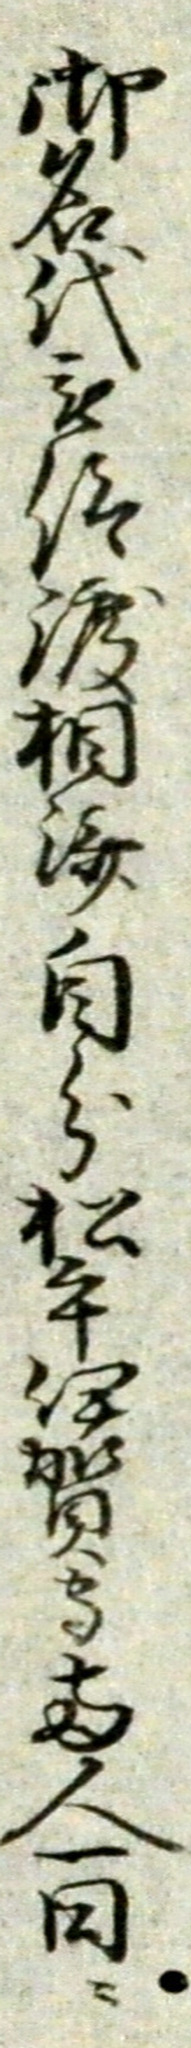御名代被仰渡相済自分松平伊賀守両人一同ニ
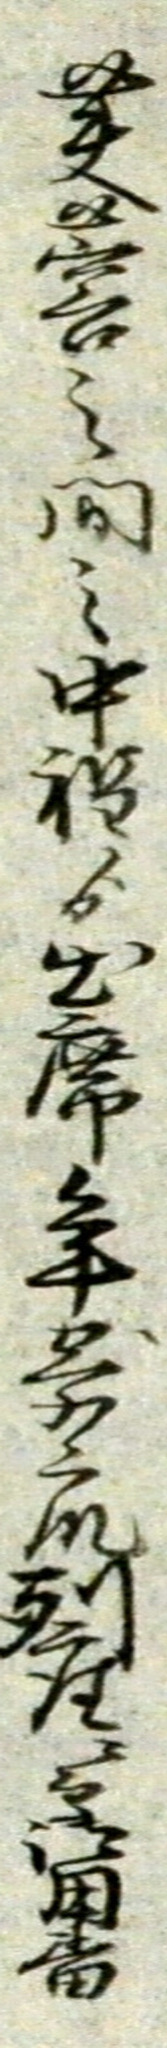芙蓉之間之中程ゟ出席年寄衆列座ニ而御用番
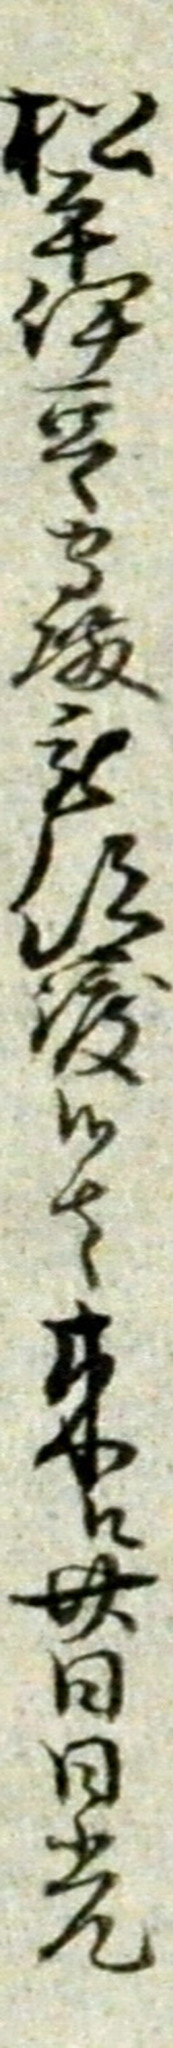松平伊豆守殿被仰渡候者来ㇽ廿日日光
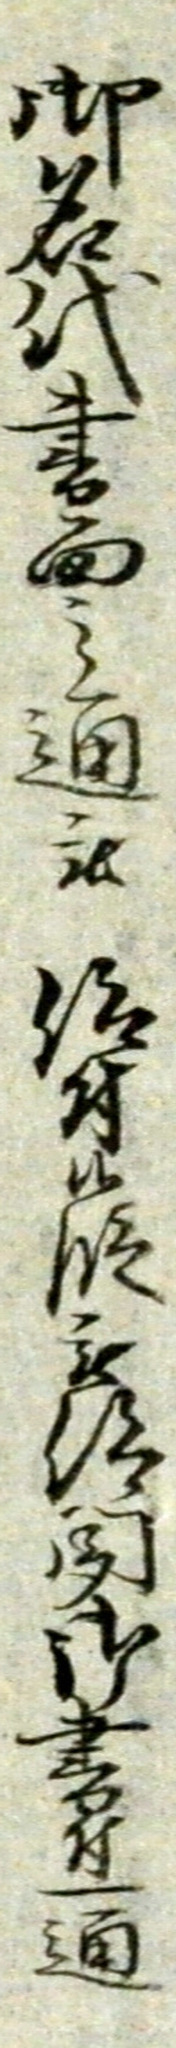御名代書面之通被仰付候段被仰聞御書付一通
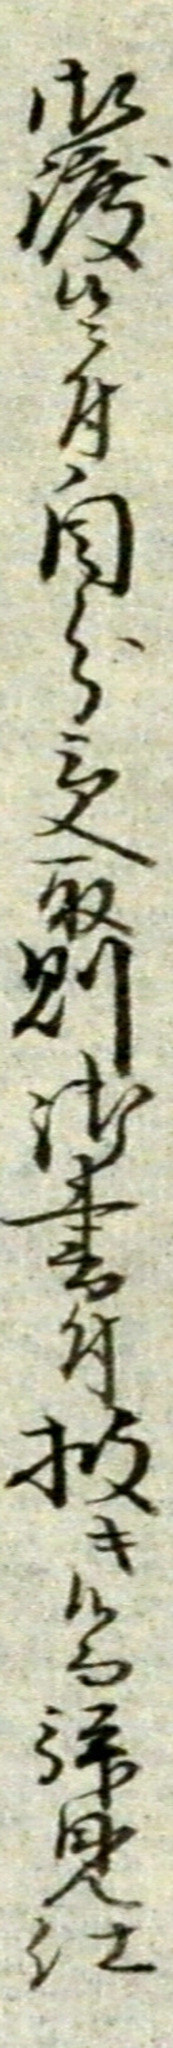御渡候ニ付自分受取則御書付披キ候而拝見仕
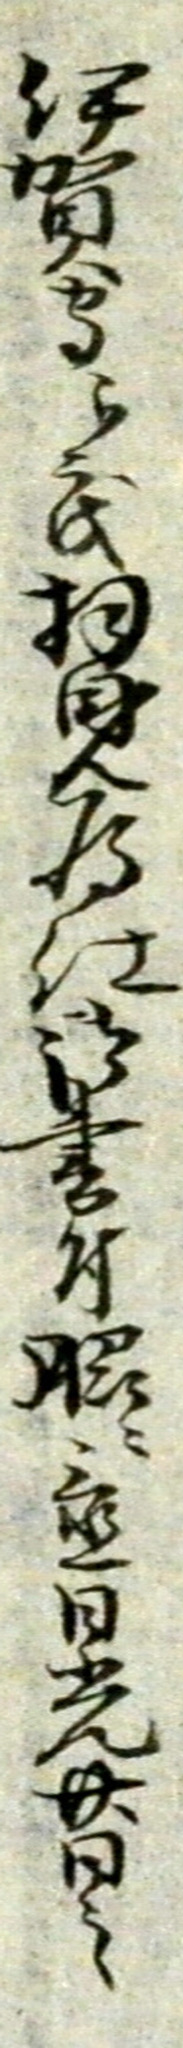伊賀守江も拝見為仕御書付脇ニ置日光廿日之
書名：日光御名代相勤候節ノ留
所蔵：伊那市立高遠町図書館・合同会社AMANE
